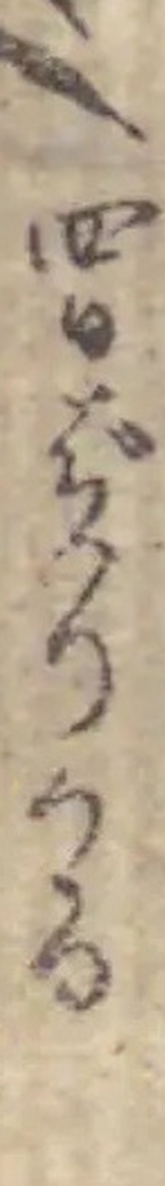四日ばかりかゝる
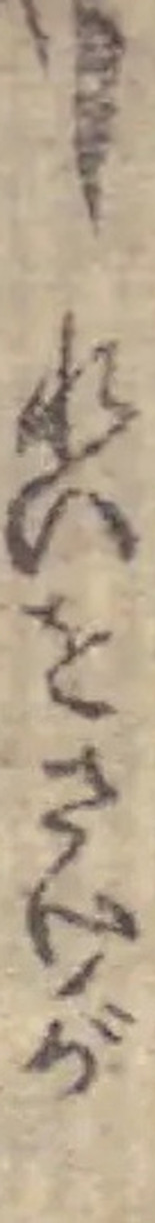れいをさけが
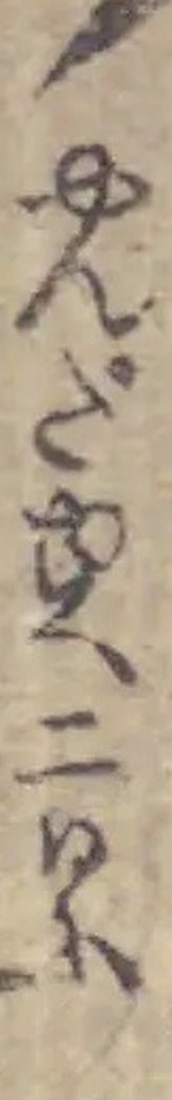やんだゆへ二日に
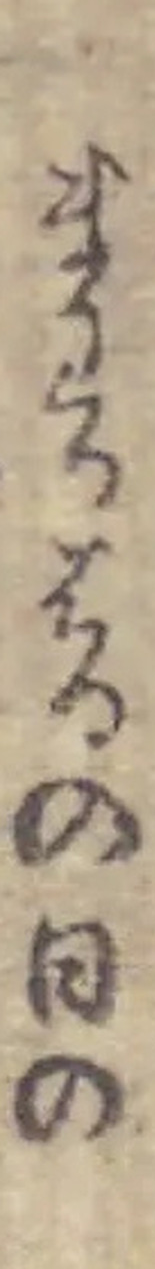まわりはるの日の
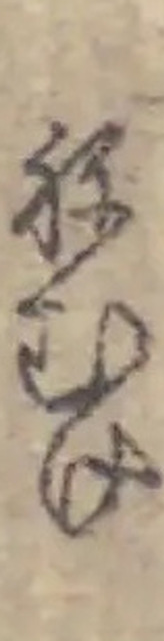ねむけ
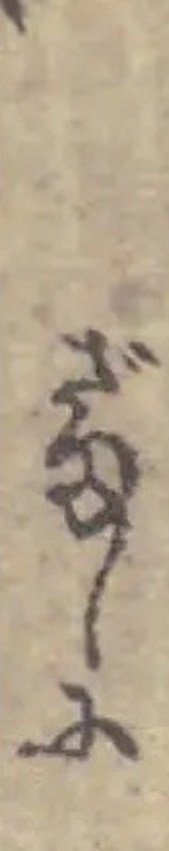ざましに
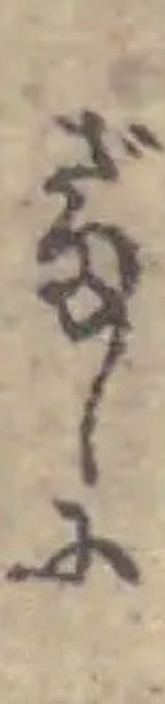ざましに
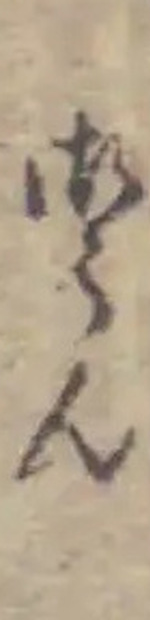御らん
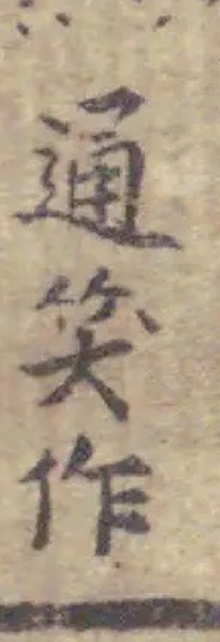通笑作
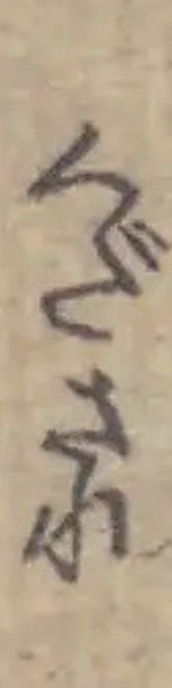くだされ
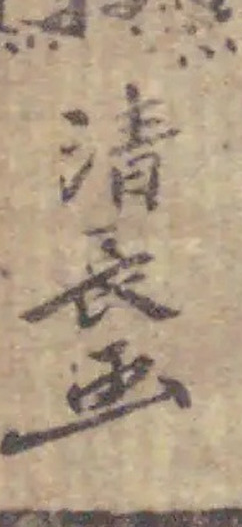清長画
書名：飲中八人前 3巻
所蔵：国立国会図書館 National Diet Library, JAPAN
